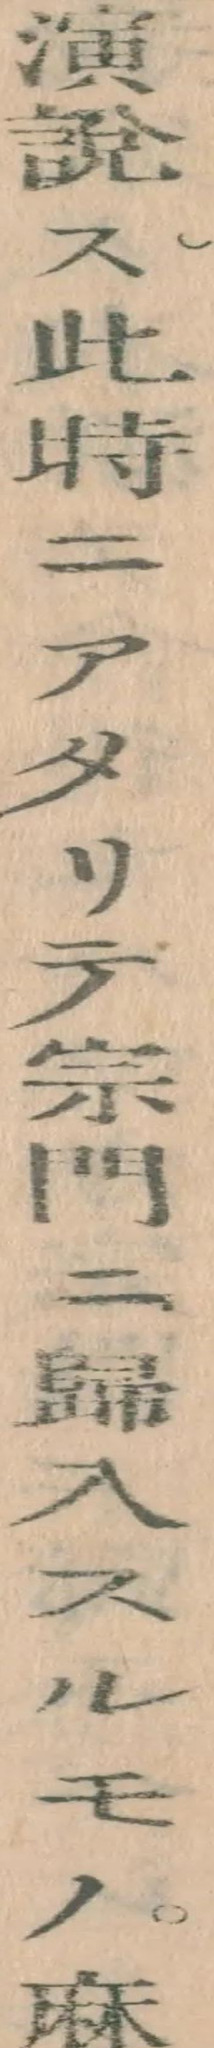演説ス。此時ニアタリテ宗門ニ帰入スルモノ。麻
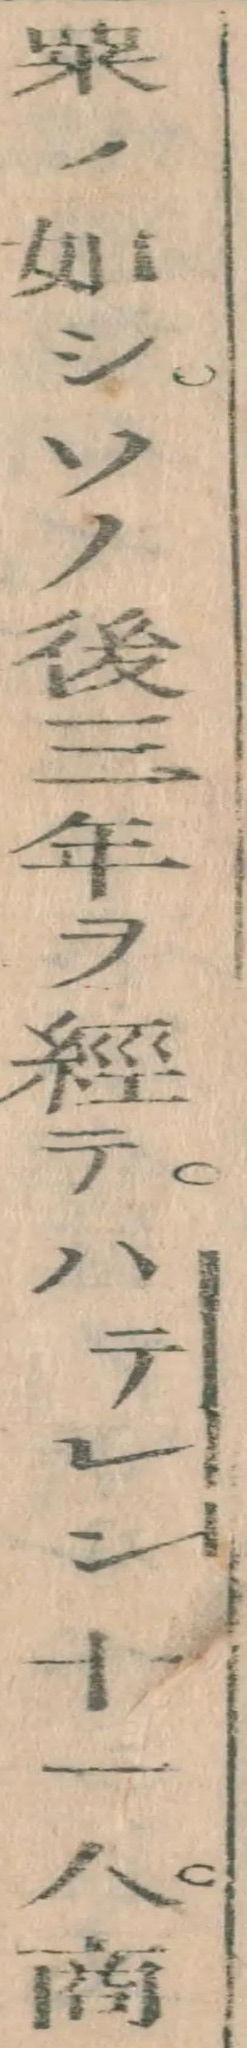粟ノ如シ。ソノ後三年ヲ経テ。ハテレン十一人。商
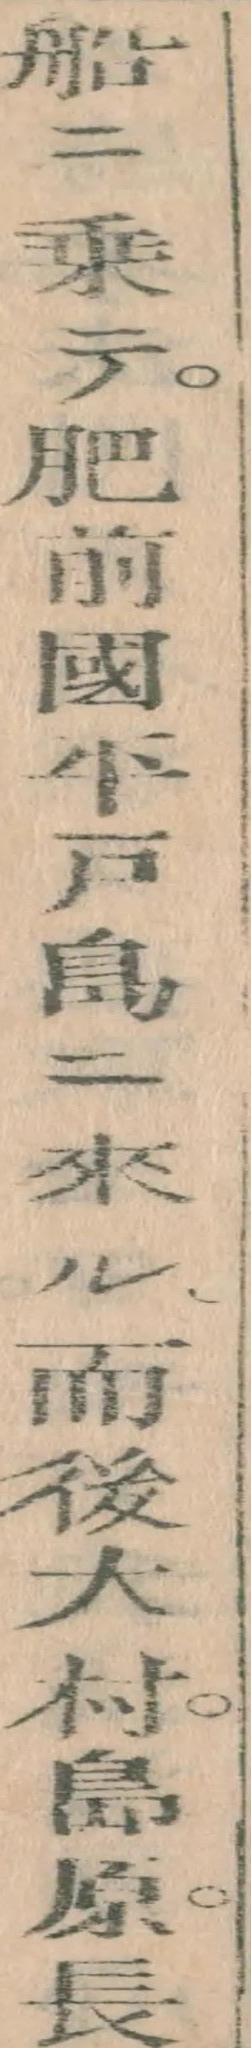船ニ乗テ。肥前国平戸島ニ来ル。而後大村。島原。長
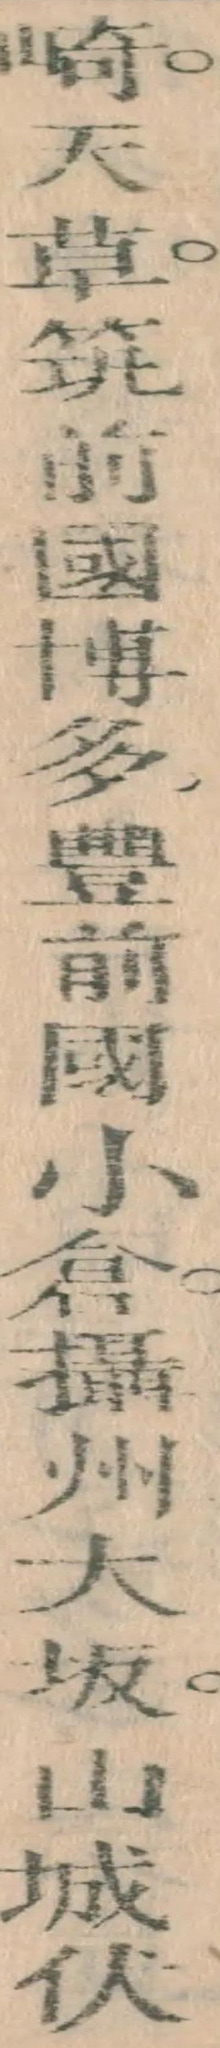崎。天草。築前国博多。豐前国小倉。摂州大坂。山城伏
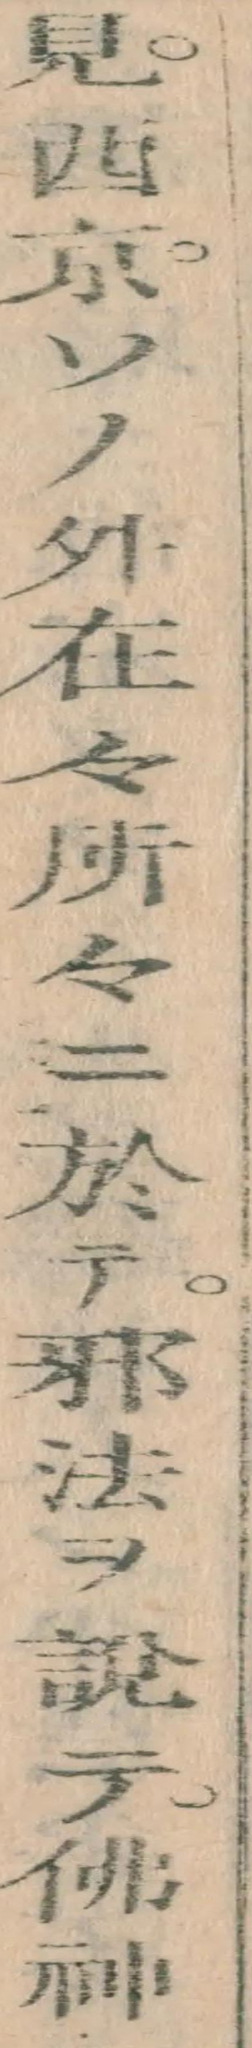見。西京。ソノ外在々所々ニ於テ。邪法ヲ説テ。仏神
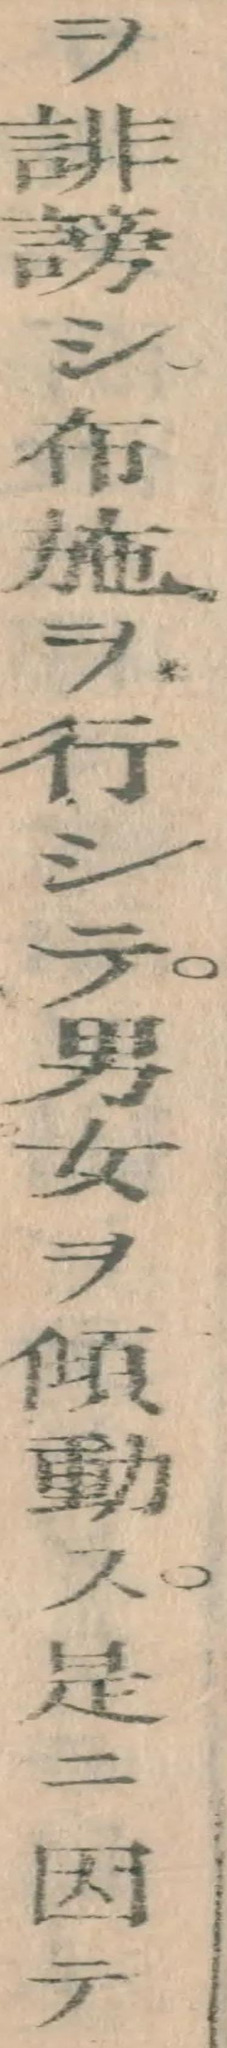ヲ誹謗シ布施ヲ行シテ。男女ヲ傾動ス。是ニ因テ
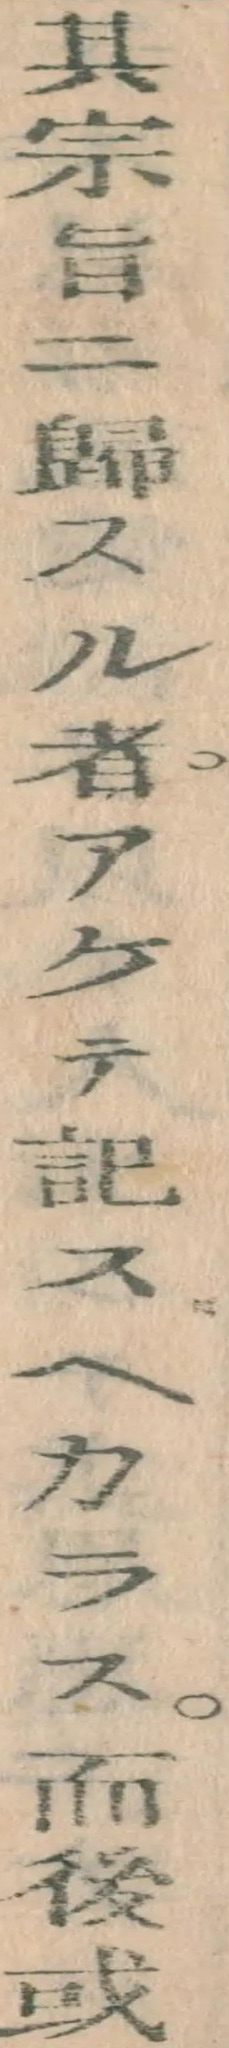其宗旨ニ帰スル者。アケテ記スヘカラス。而後或
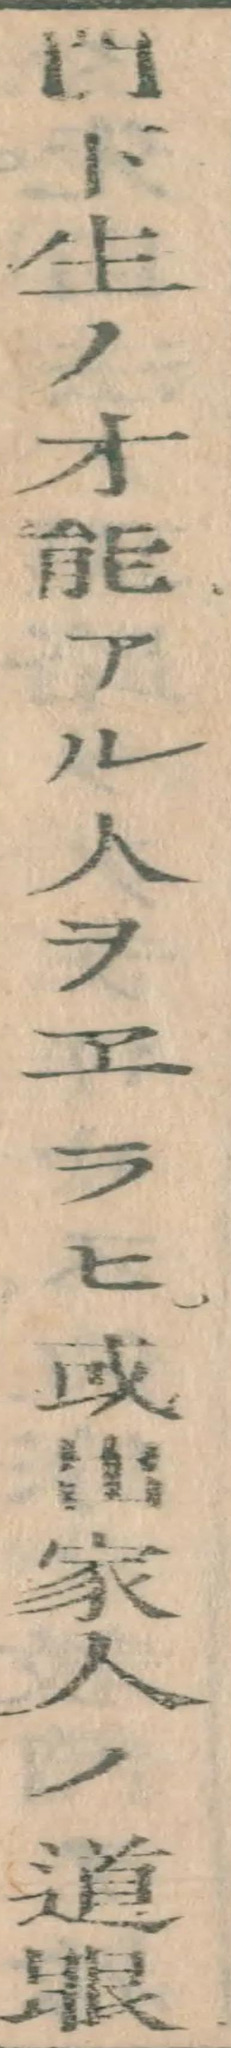門下生ノ才能アル人ヲヱラヒ。或出家人ノ道眼
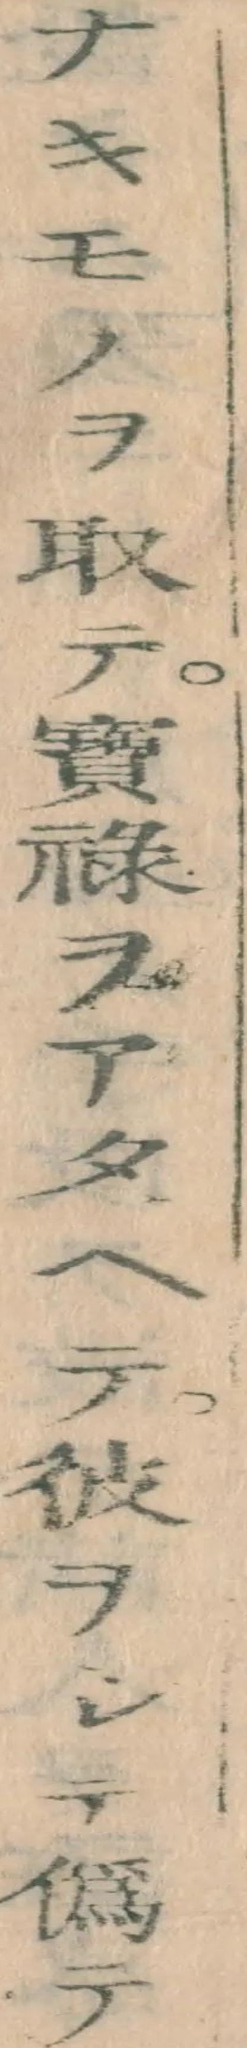ナキモノヲ取テ。宝禄ヲアタヘテ。彼ヲシテ偽テ
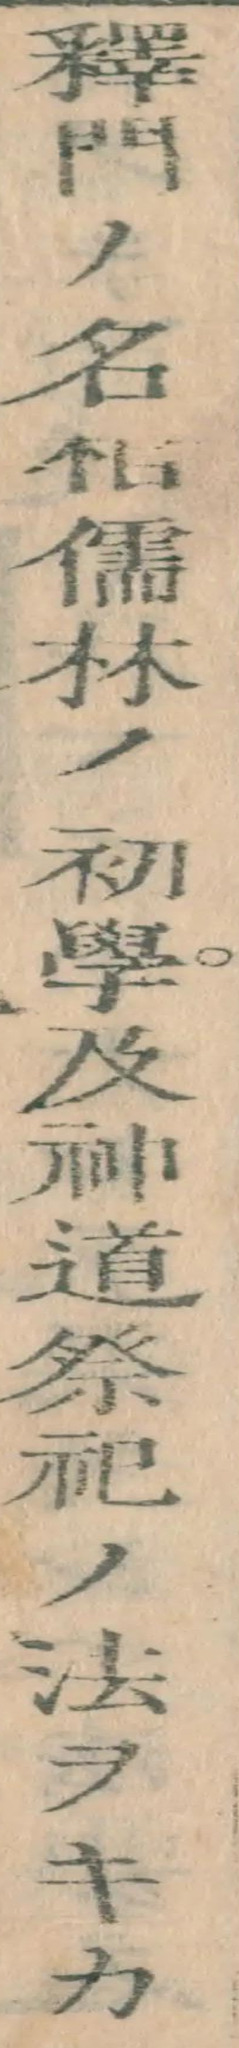釈門ノ名相儒林ノ初学。及神道祭祀ノ法ヲキカ

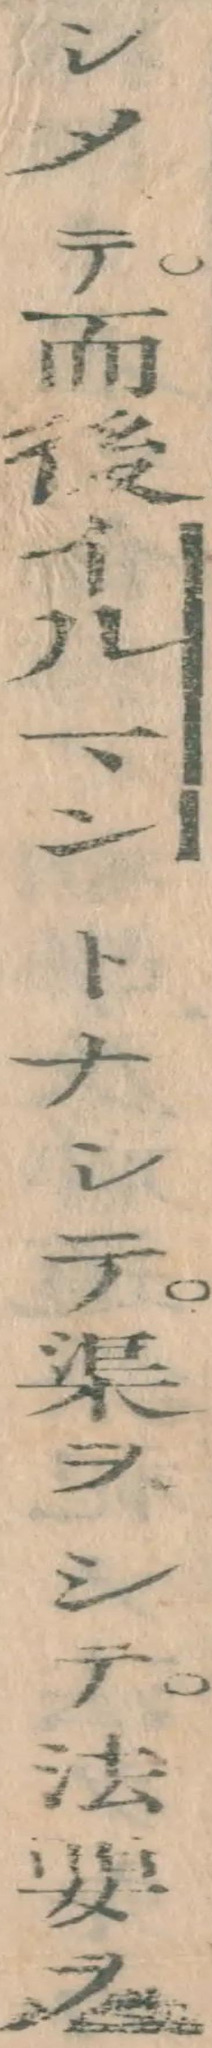シメテ。而後イルマントナシテ。渠ヲシテ。法要ヲ
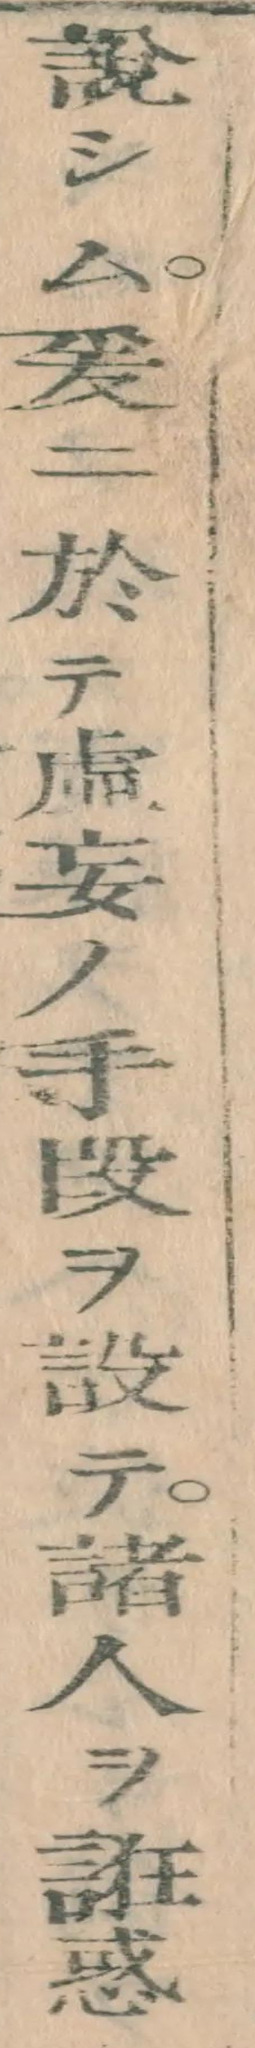説シム。爰ニ於テ虚妄ノ手段ヲ設テ。諸人ヲ誑惑
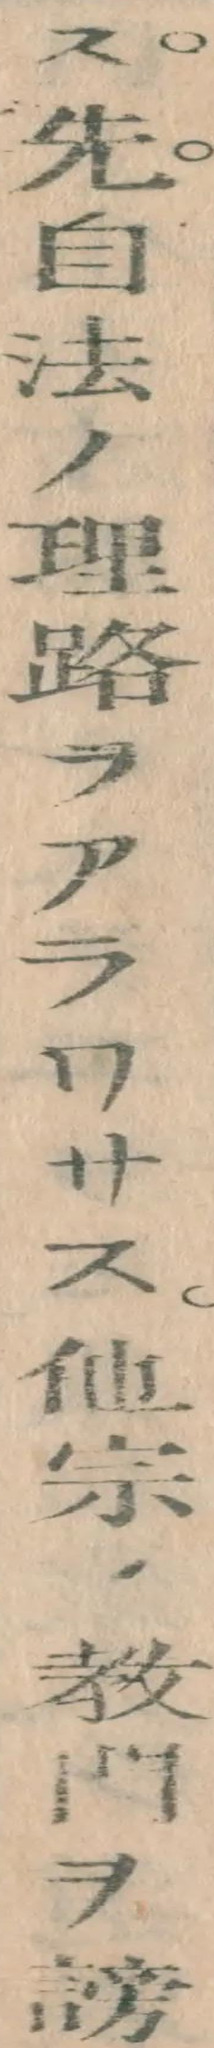ス。先。自法ノ理路ヲアラワサス。他宗ノ教門ヲ謗
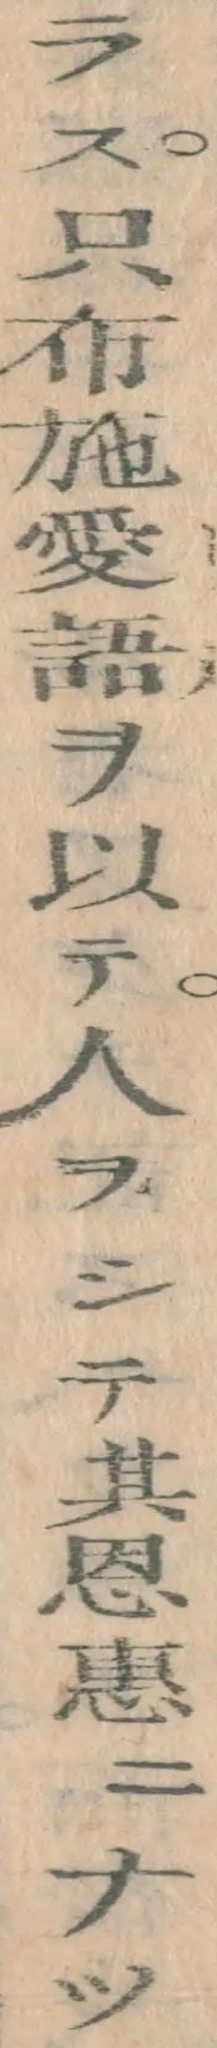ラス。只布施愛語ヲ以テ。人ヲシテ其恩恵ニナツ
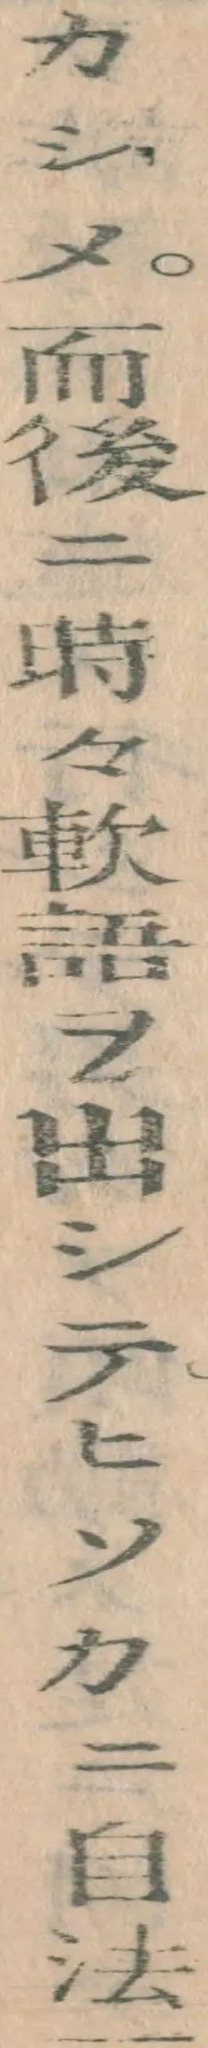カシメ。而後ニ時々軟語ヲ出シテ。ヒソカニ自法
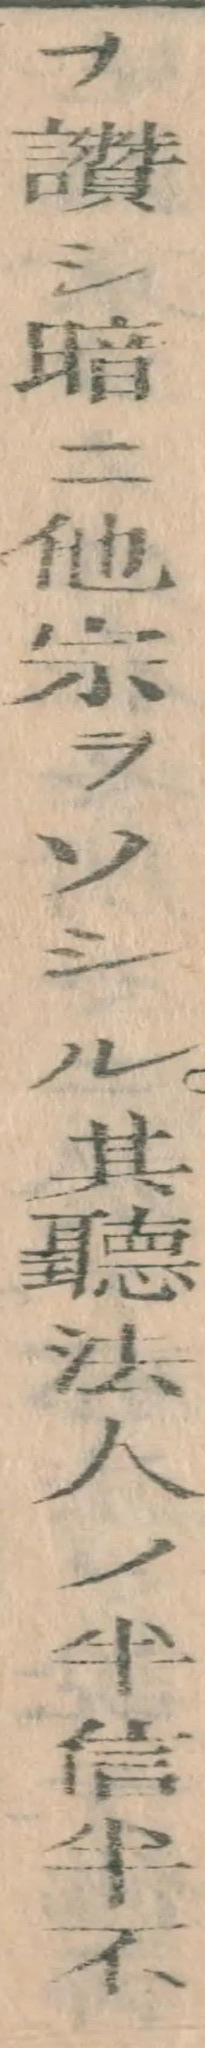ヲ讃シ暗ニ他宗ヲソシル。其聴法人ノ。半信半不
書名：南蛮寺興廃記
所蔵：国立国会図書館 National Diet Library, JAPAN
